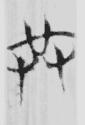共
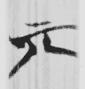亓
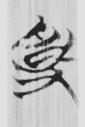事
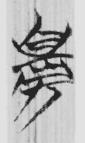臱
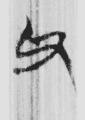父
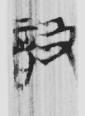{言𠃌又}
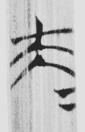夫=
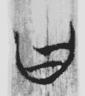曰
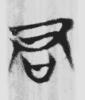君
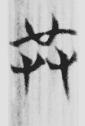共
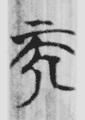而
